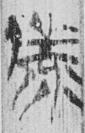備（服）
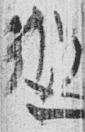○（過）
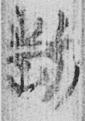折（制）
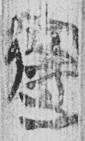○（失）
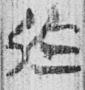於
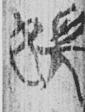{女𡵂}（美）
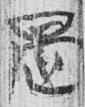是
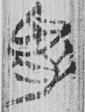{胃刀}（謂）
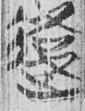違
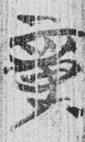章
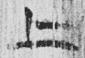上
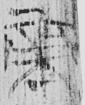帝
